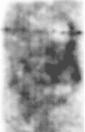紫
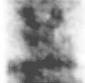之
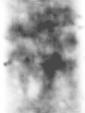○（表）
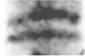二
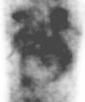紫
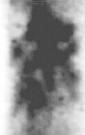○（紕）
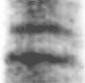二
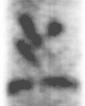之
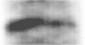一
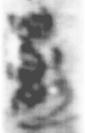○（貂）
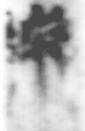與
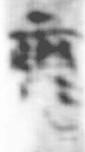彔（綠）
